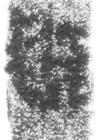鉉
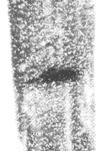一
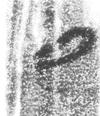㠯（以）
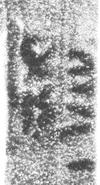○（錦）
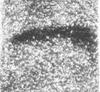一
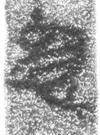食
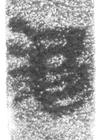○（醬）
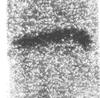一
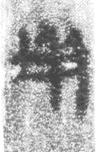○（瓶）
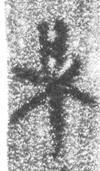某（梅）
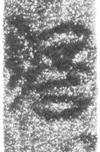○（醬）
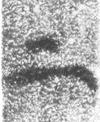二
